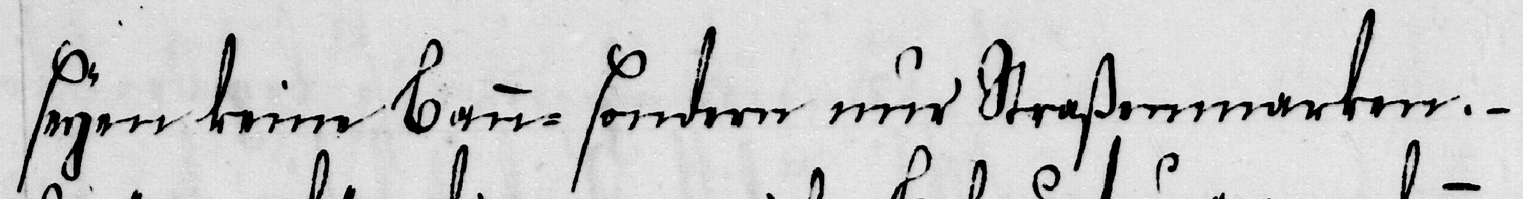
seyen keine Bann- sondern nur Straßenmarken.
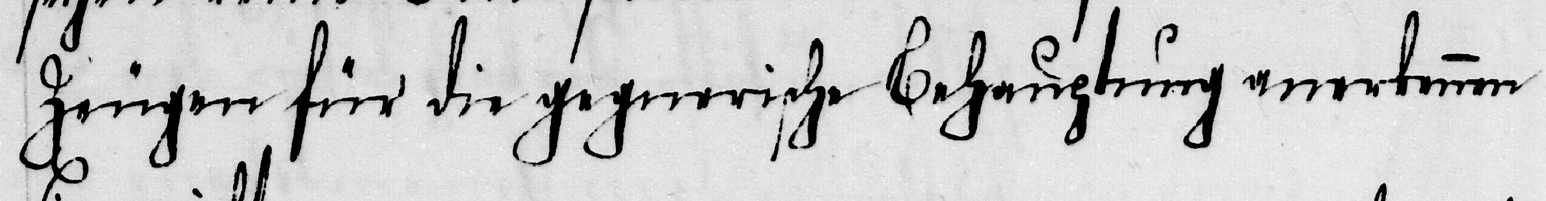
Zeugen für die gegnerische Behauptung anerkennen
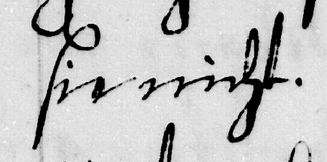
sie nicht.
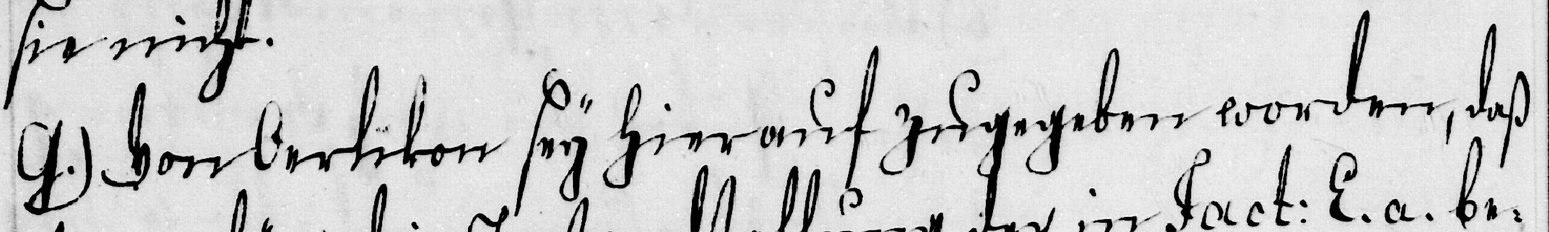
G.) Von Oerlikon sey hierauf zugegeben worden, daß
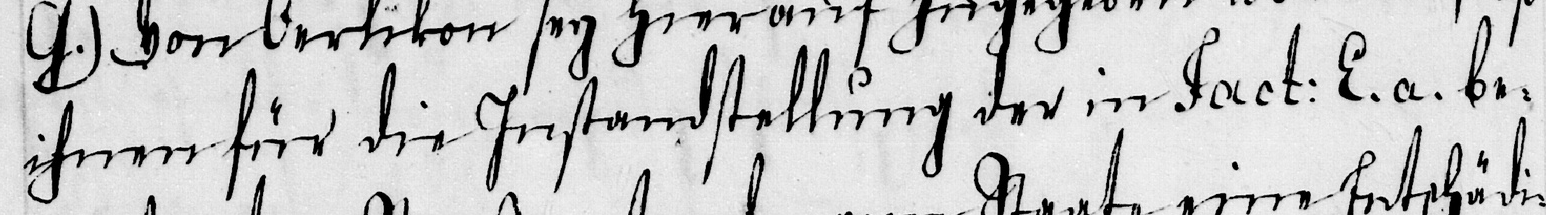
ihnen für die Instandstellung der in Fact: E. a. be¬
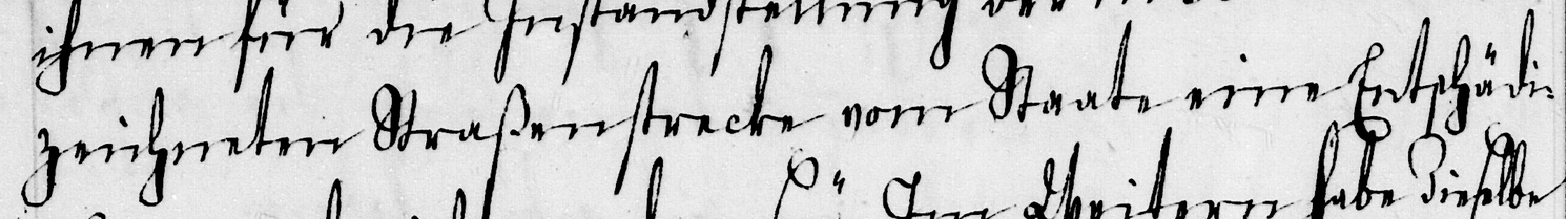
zeichneten Straßenstrecke vom Staate eine Entschädi¬
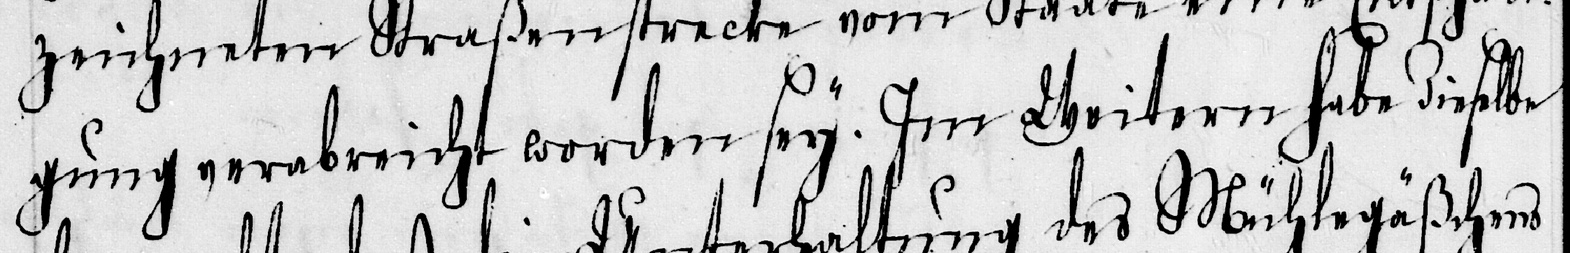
gung verabreicht worden sey. Im Weitern habe dieselbe
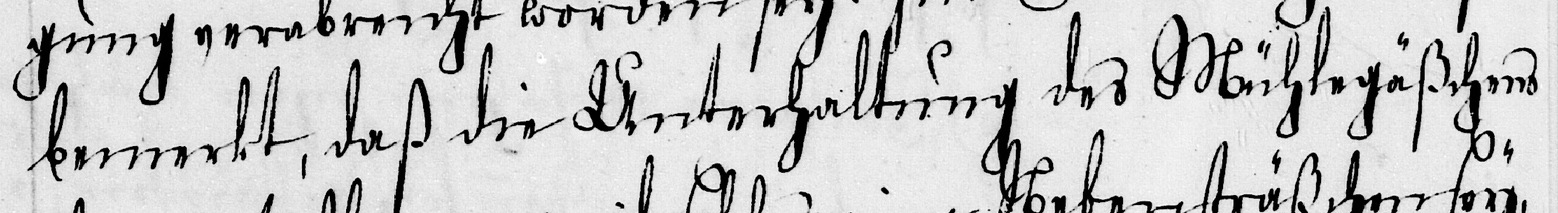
bemerkt, daß die Unterhaltung des Mühlegäßchens
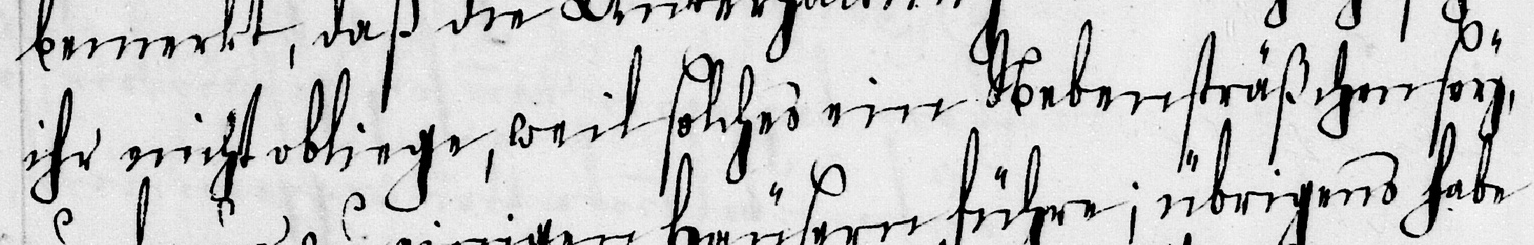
ihr nicht obliege, weil solches ein Nebensträßchen sey,
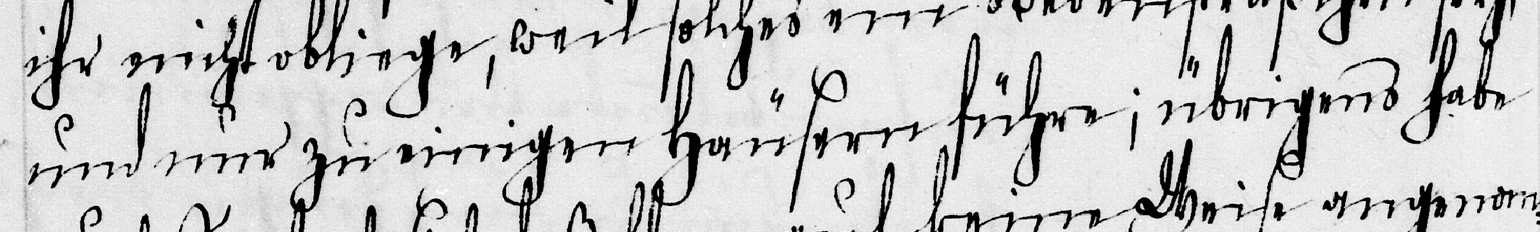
und nur zu einigen Häusern führe; übrigens habe
